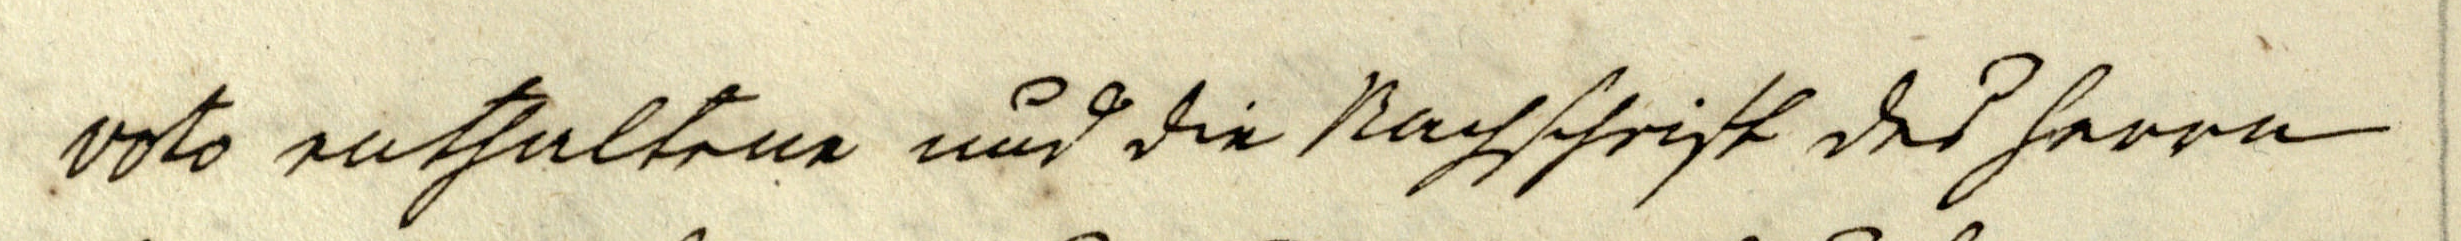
voto enthaltene und die Nachschrift des Herrn
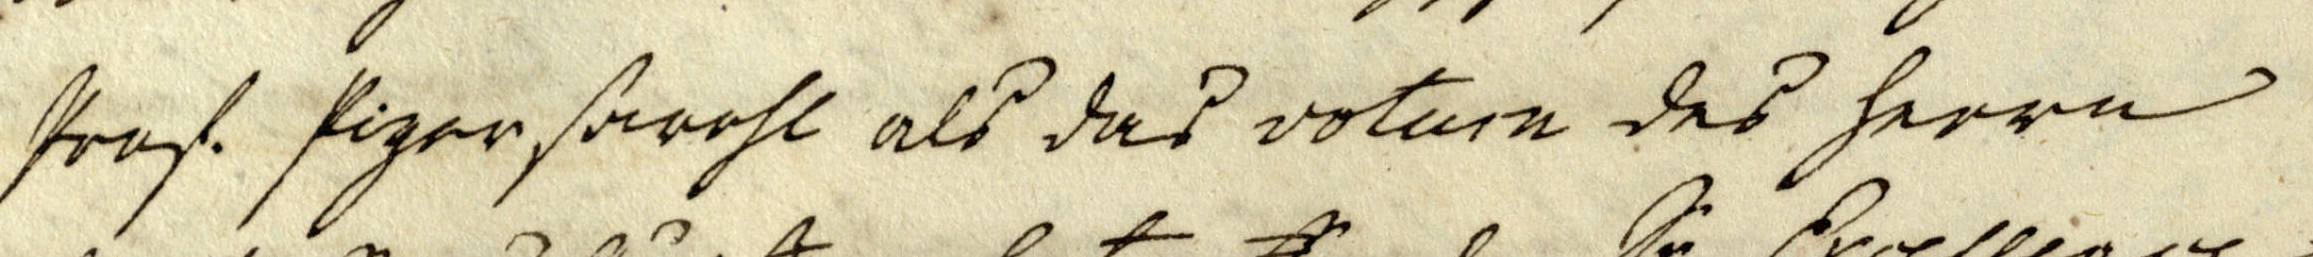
Prof. Piper sowohl als das votum des Herrn
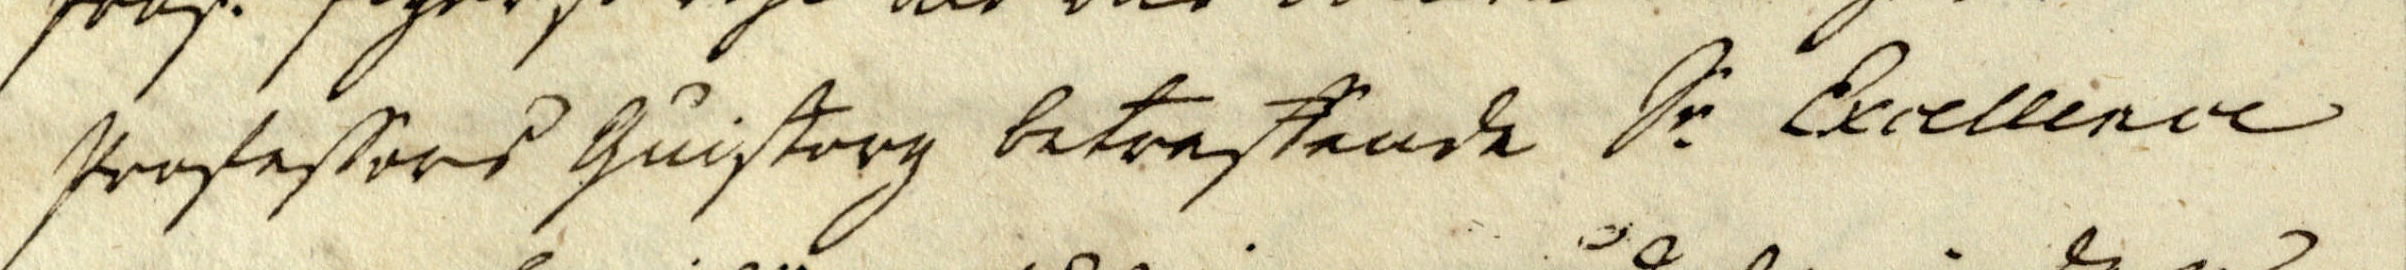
Professors Quistorp betreffende Sr Excellence
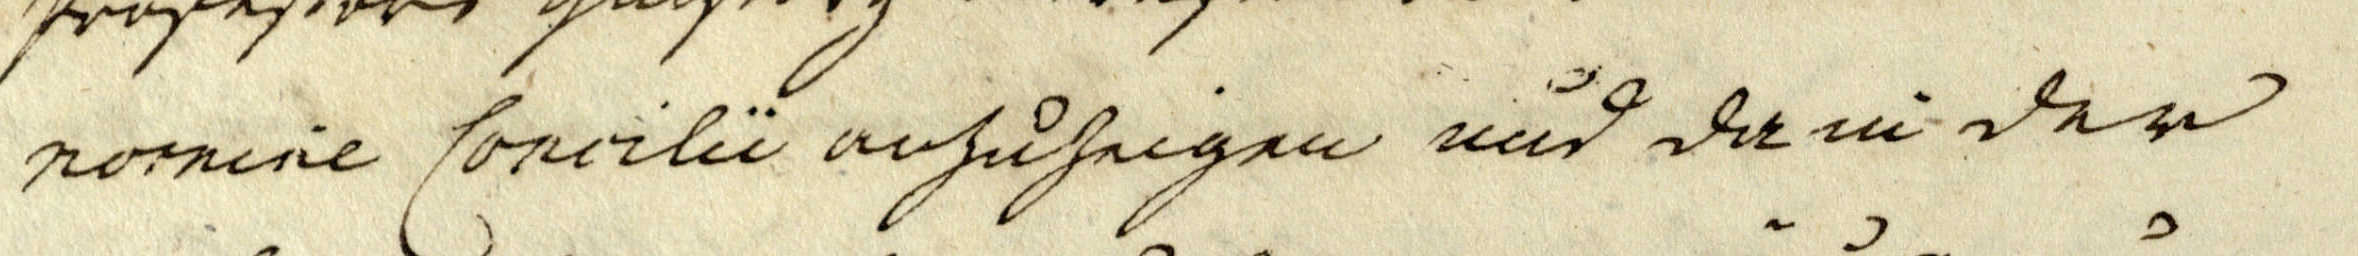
nomine Concilii anzuzeigen und da in der
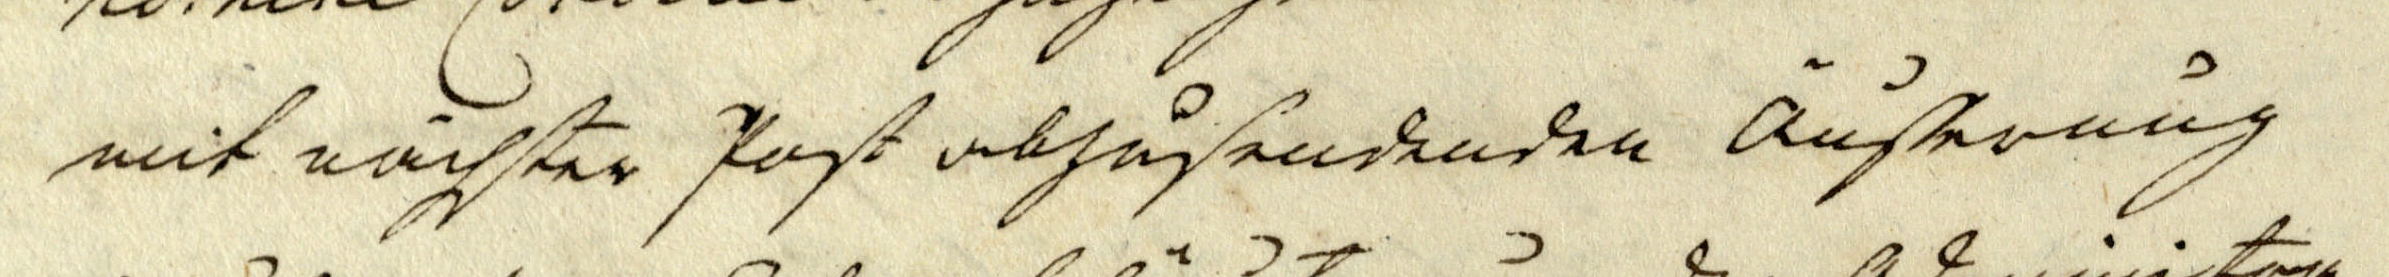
mit nächster Post abzusendenden Äusserung
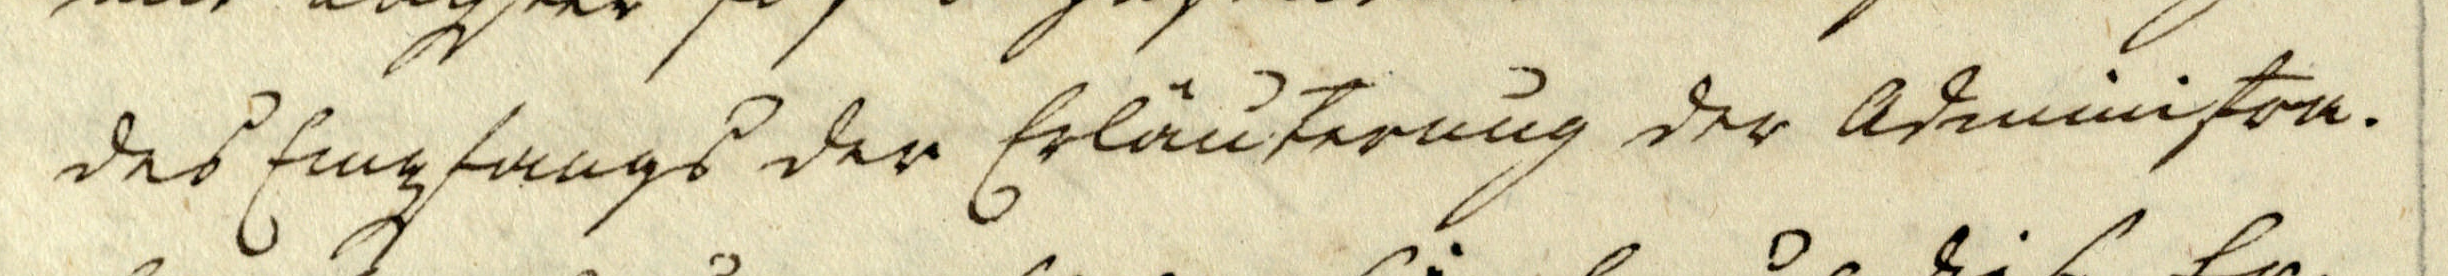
des Empfangs der Erläuterung der Administra¬
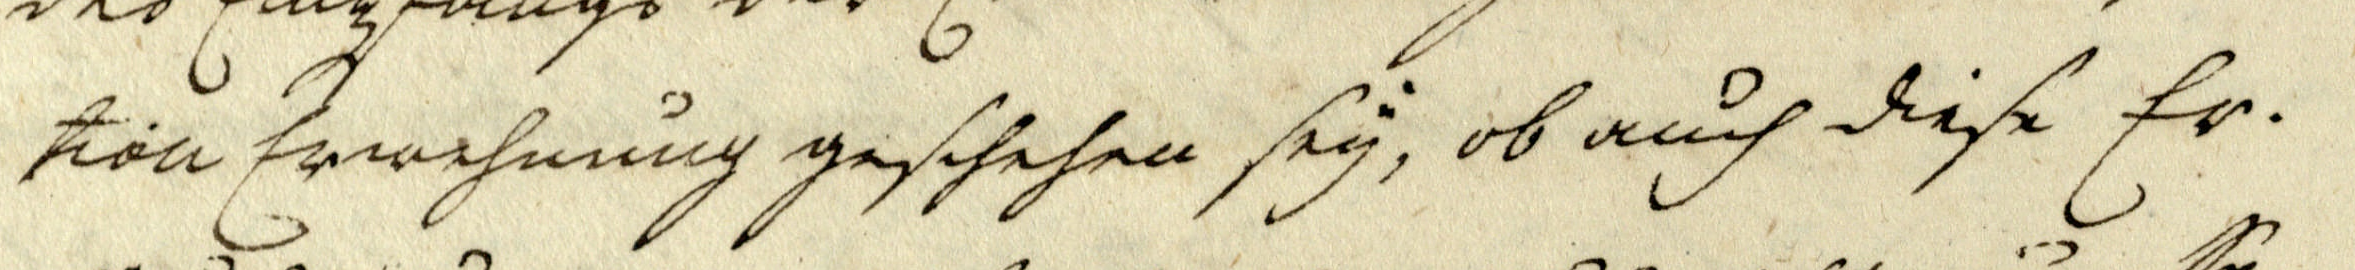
tion Erwehnung geschehen seÿ, ob auch diese Er¬
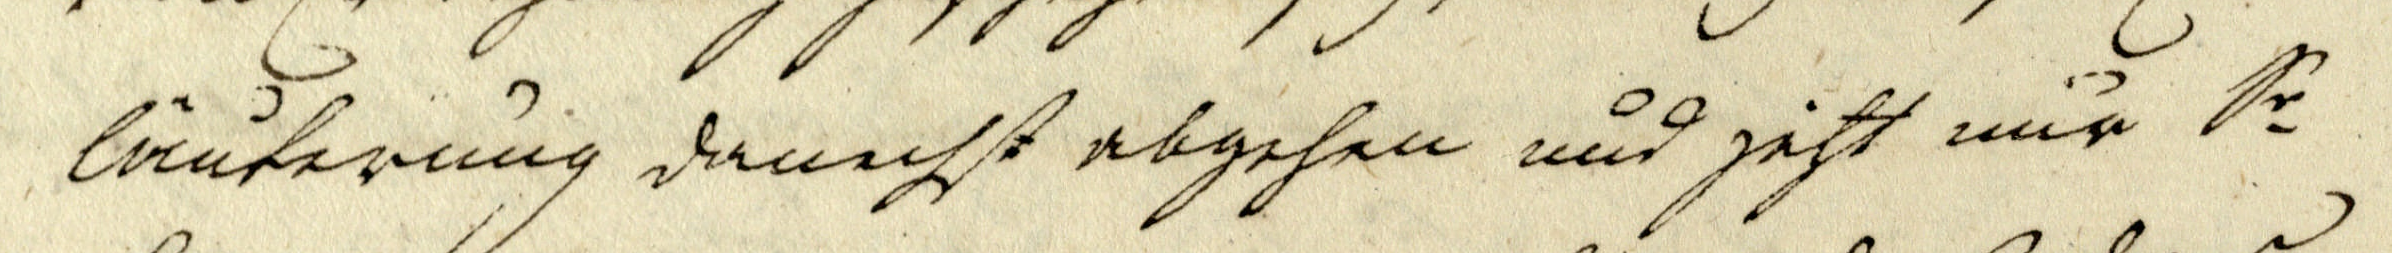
läuterung danechst abgehen und jetzt nur Sr.
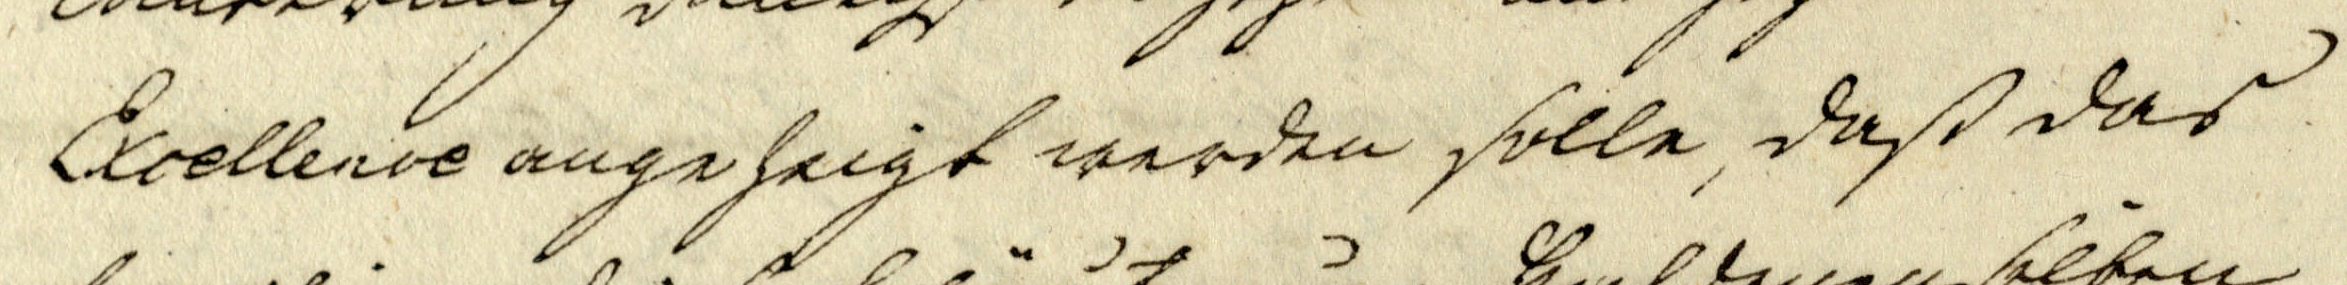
Excellence angezeigt werden solle, daß das
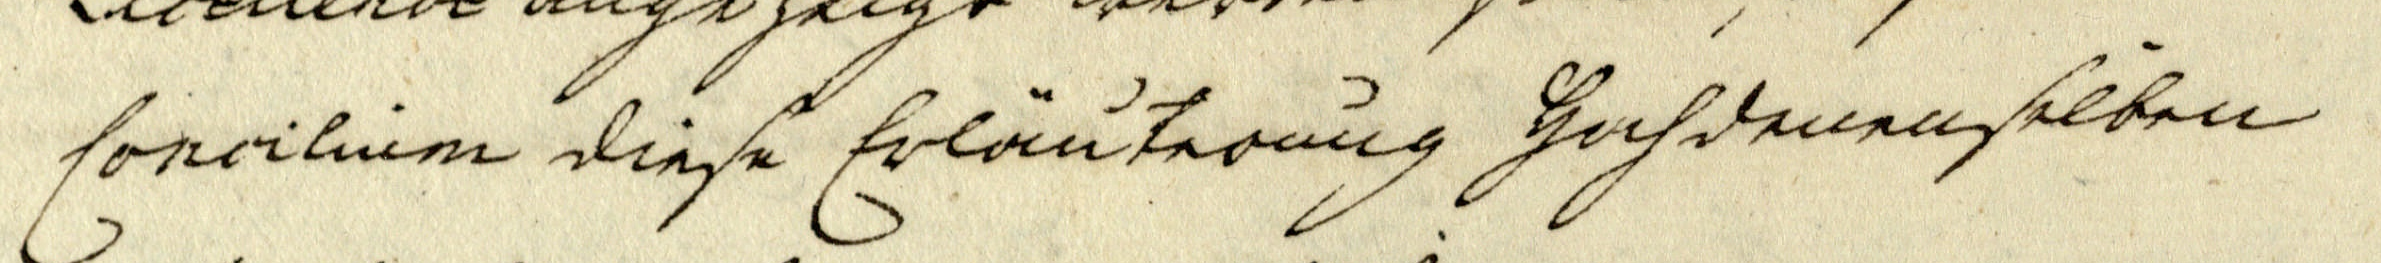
Concilium diese Erläuterung Hochdenenselben
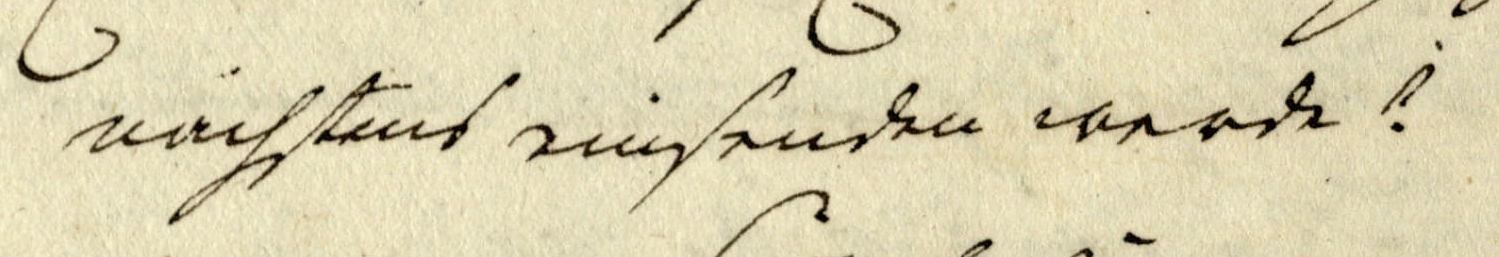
nächstens einsenden werde ?
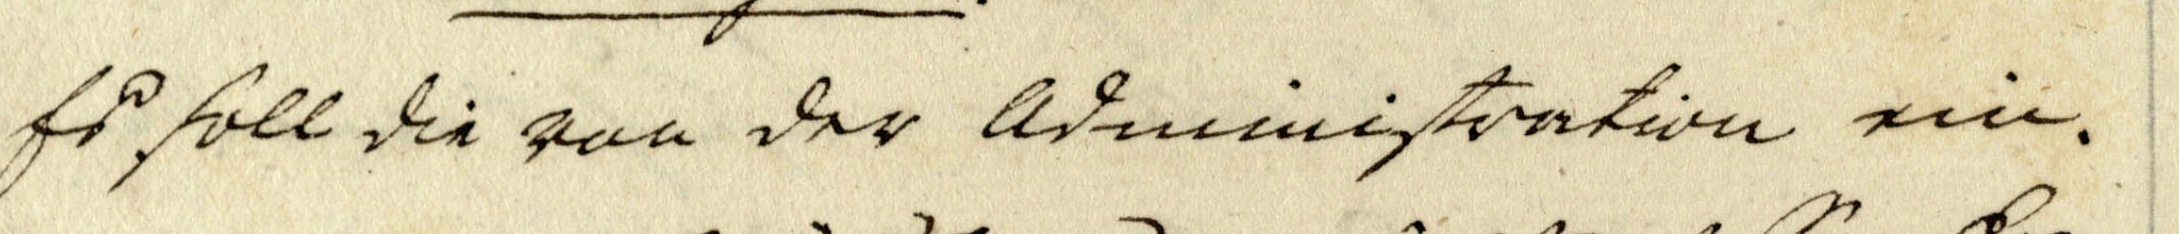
Es soll die von der Administration ein¬
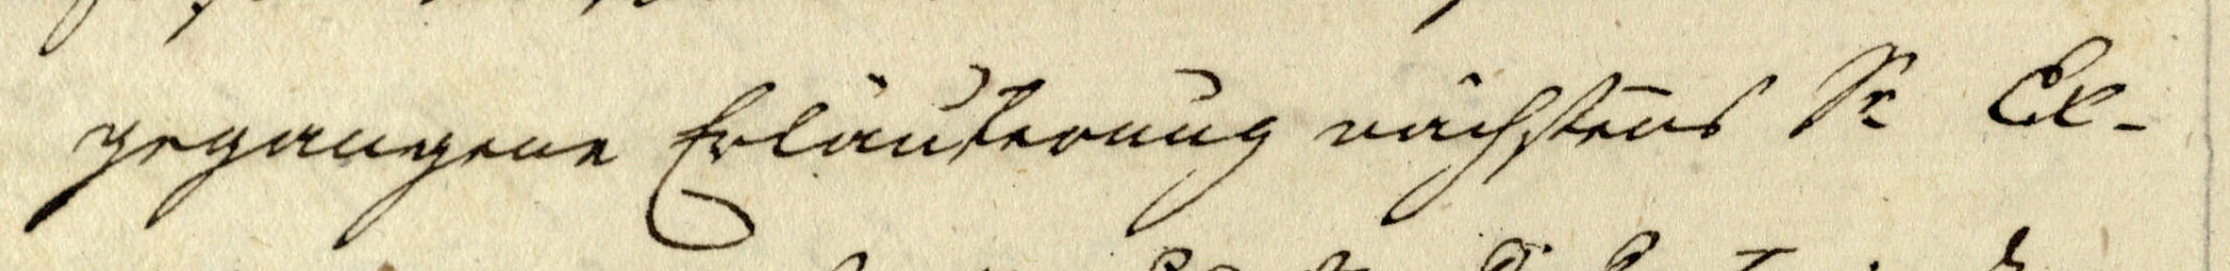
gegangene Erläuterung nächstens Sr Ex¬
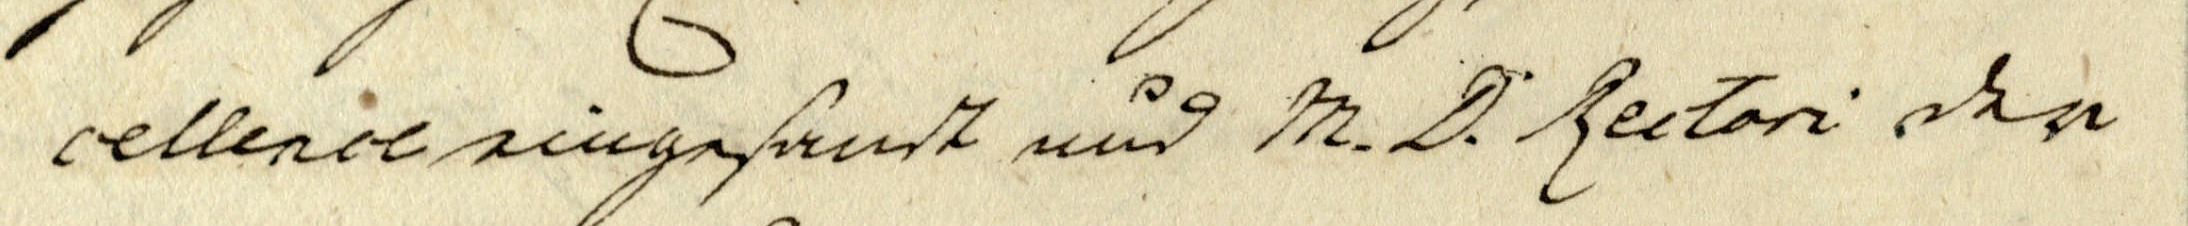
cellence eingesandt und M. D. Rectori der
